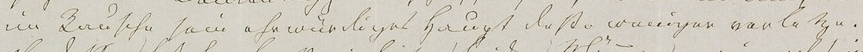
im Rausche sein ehrwürdiges Haupt desto weniger verletze.
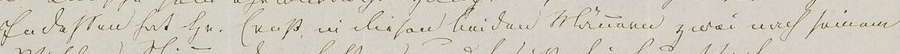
Indessen hat Hr. Ernst in diesen beiden Männern zwei nach seinem
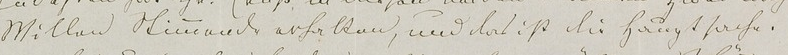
Willen Stimmende erhalten, und das ist die Hauptsache.
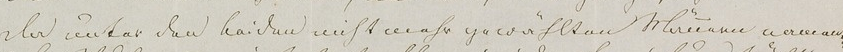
Da unter den beiden nicht mehr gewählten Männern nament-
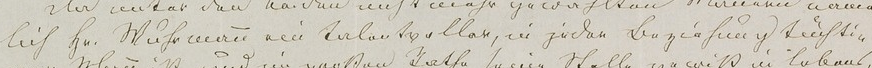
lich Hr. Wuhrmann ein talentvoller, in jeder Beziehung tüchti-
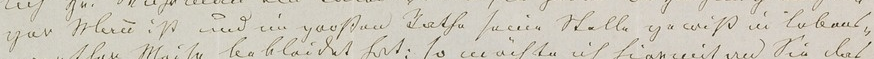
ger Mann ist und im großen Rathe seine Stelle gewiß in lobens-
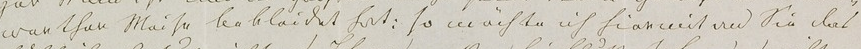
werther Weise bekleidet hat: so möchte ich hiermit an Sie das
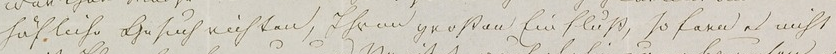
höfliche Gesuch richten, Ihren großen Einfluß, so fern es nicht
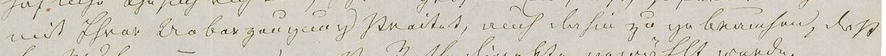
mit Ihrer Ueberzeugung streitet, auch dahin zu gebrauchen, daß
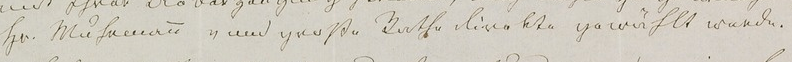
Hr. Wuhrmann vom große Rathe direkte gewählt werde.
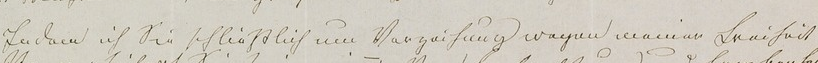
Indem ich Sie schließlich um Verzeihung wegen meiner Freiheit
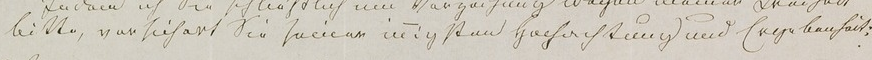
bitte, versichert Sie seiner innigsten Hochachtung und Ergebenheit:
